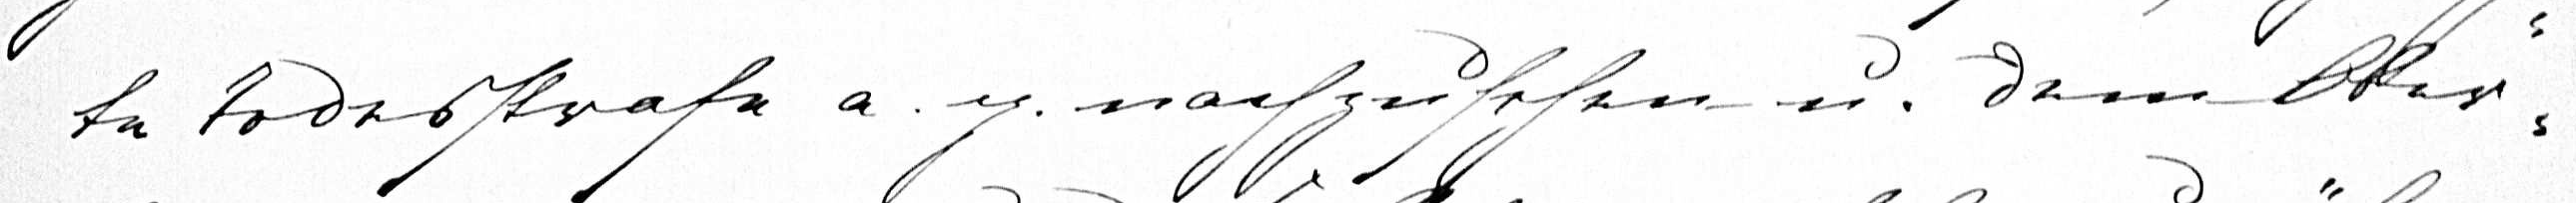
te Todesstrafe a.g. nachzusehen u. dem Ober¬
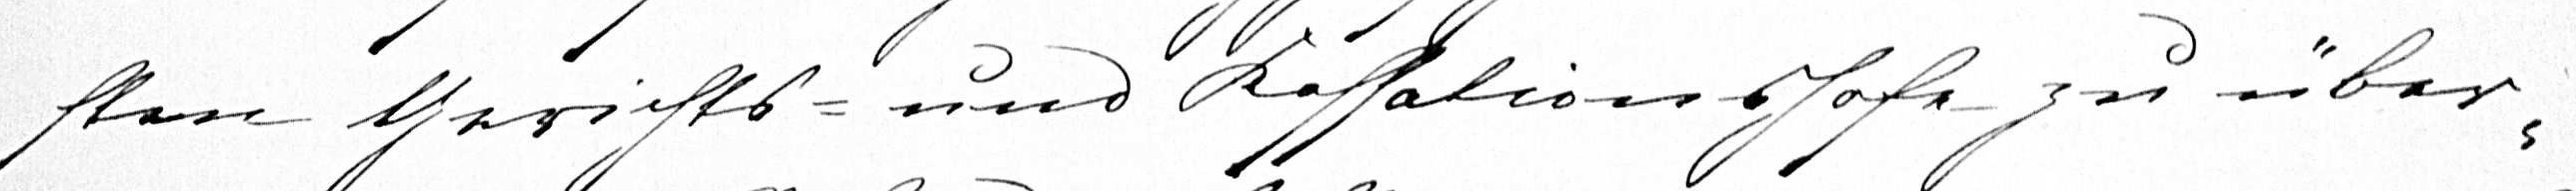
sten Gerichts- und Kassationshofe zu über¬
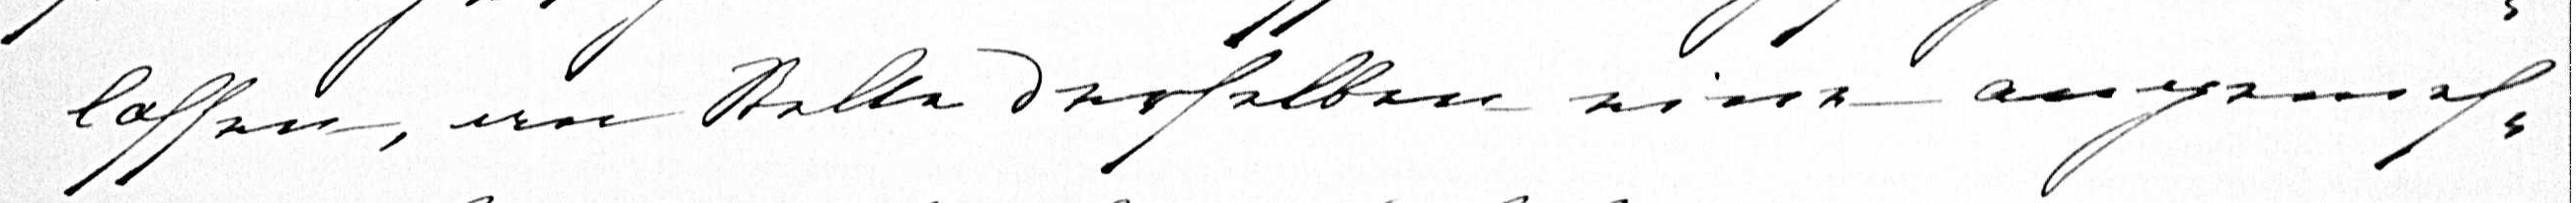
lassen, an Stelle derselben eine angemes¬
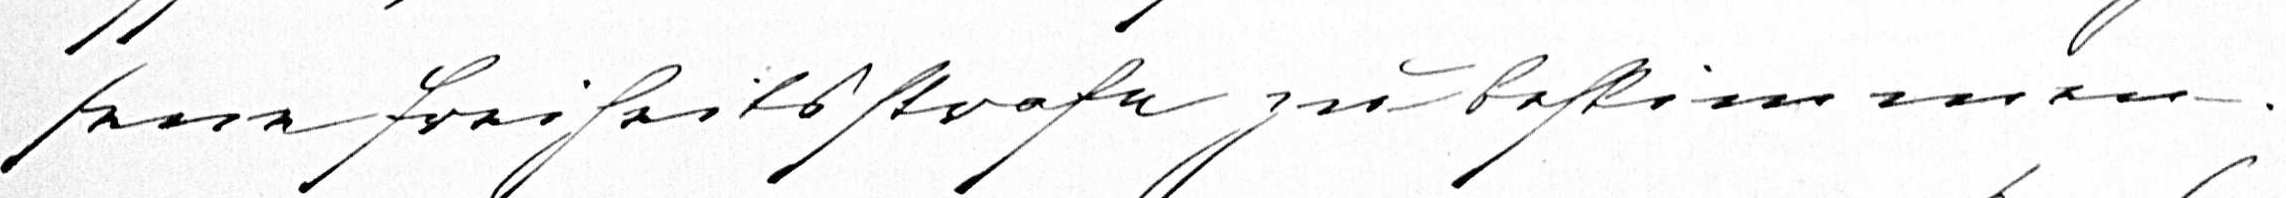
sene Freiheitsstrafe zu bestimmen.
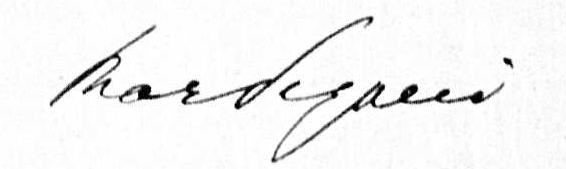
Mardegani
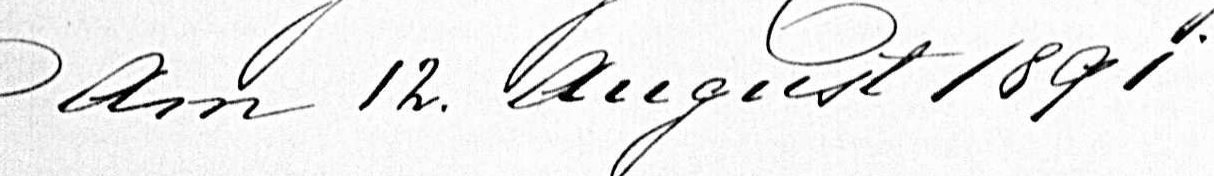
Am 12. August 1891
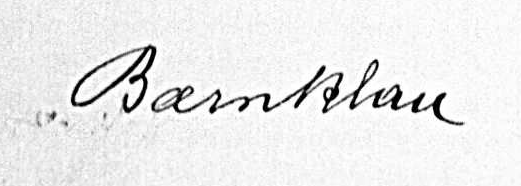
Baernklau
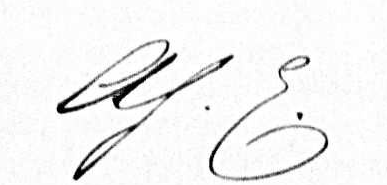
Ah. E.
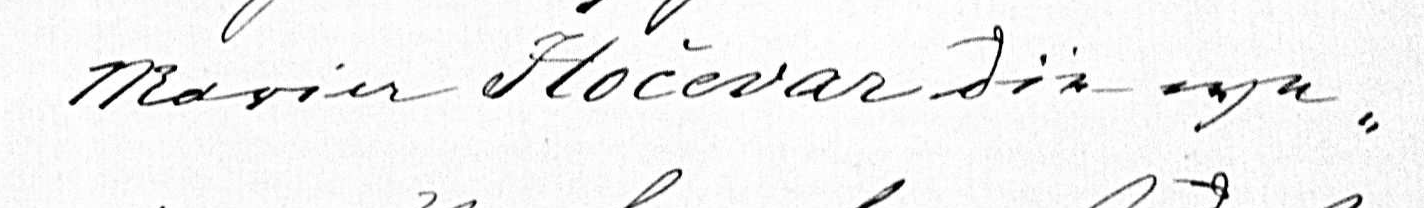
Maria Hočevar die we¬
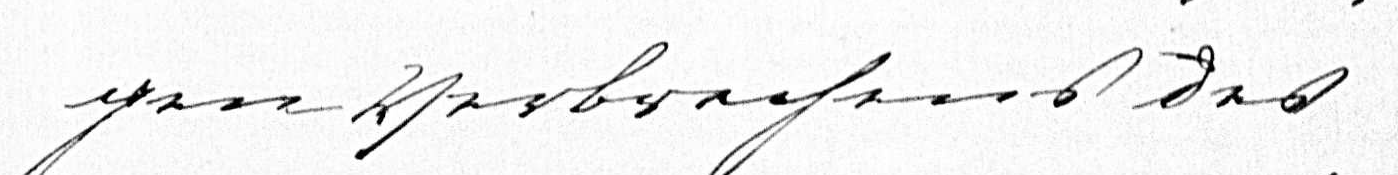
gen Verbrechens des
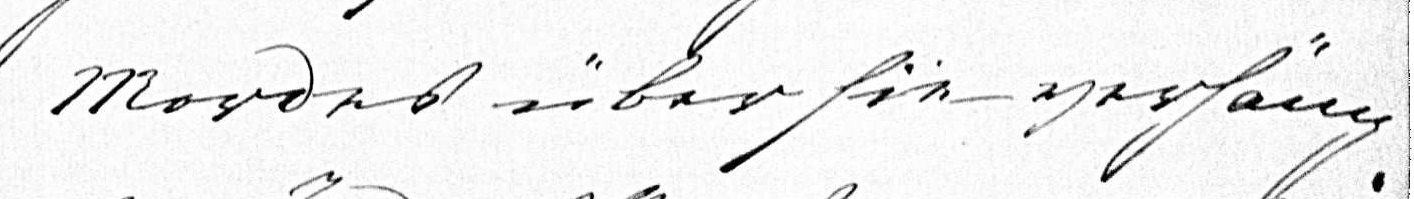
Mordes über sie verhäng¬
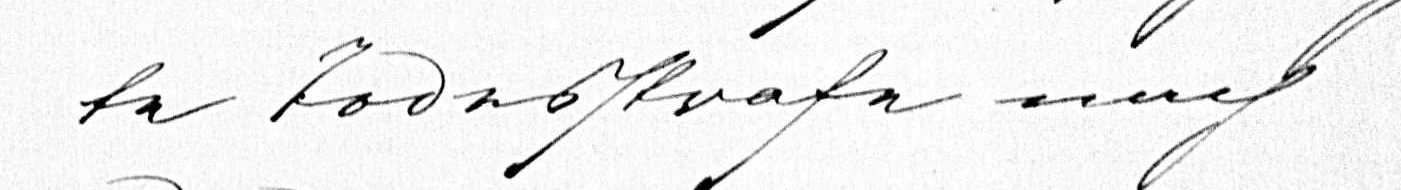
te Todesstrafe nach
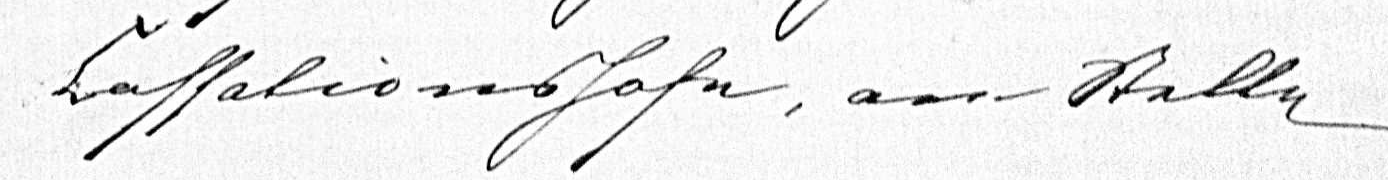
Cassationshofe, an Stelle
